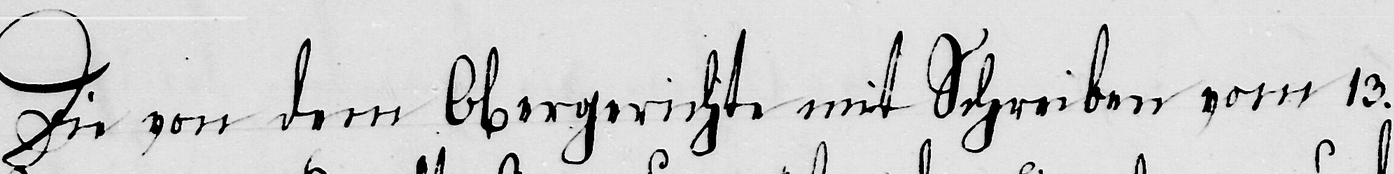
Die von dem Obergericht mit Schreiben vom 13.
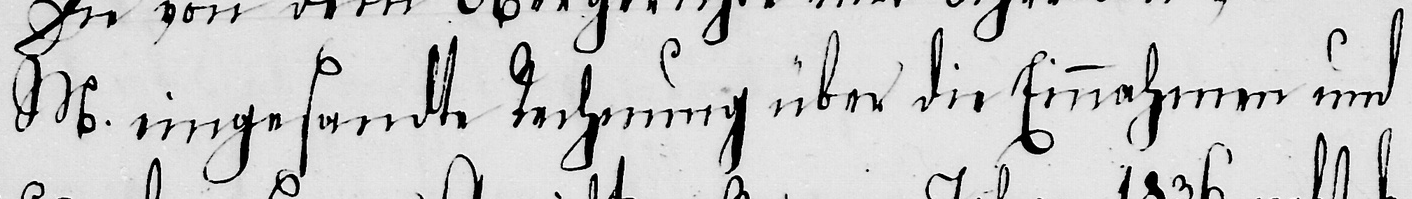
M. eingesandte Rechnung über die Einnahmen und
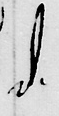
d.
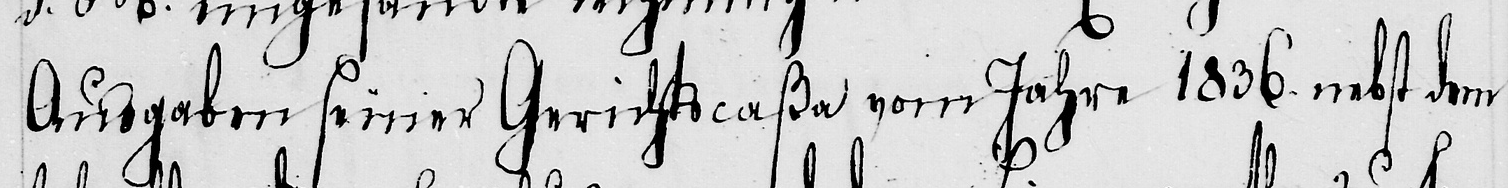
Ausgaben seiner Gerichtscaßa vom Jahre 1836. nebst dem
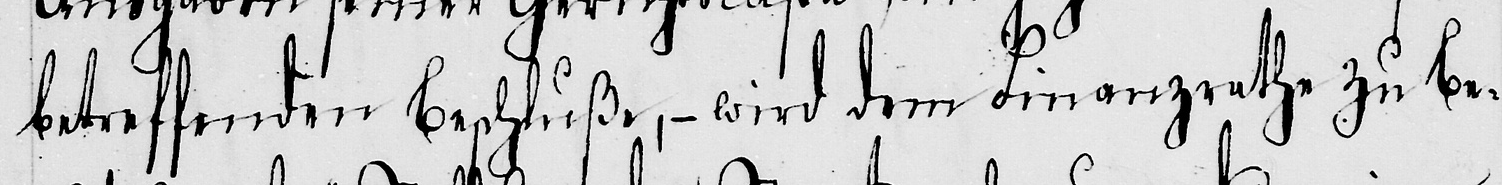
betreffenden Beschluße, – wird dem Finanzrathe zu Be¬
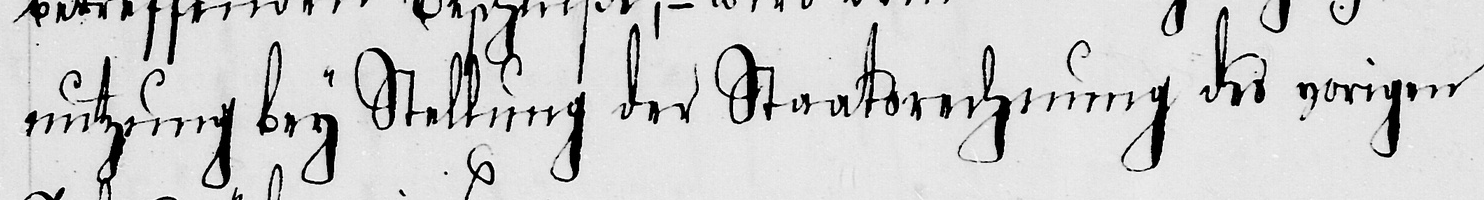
nutzung bey Stellung der Staatsrechnung des vorigen
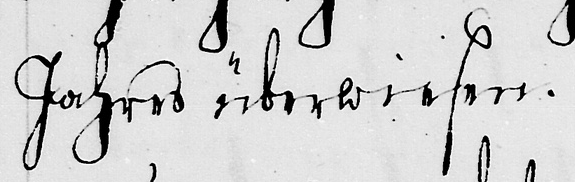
Jahres überwiesen.
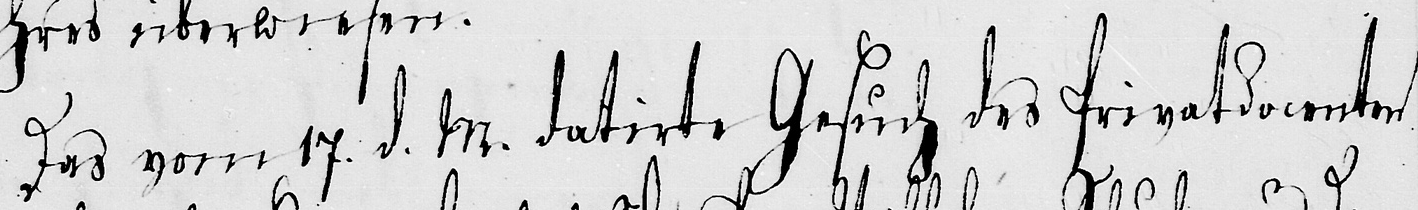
Das vom 17. d. M. datirte Gesuch des Privatdocenten
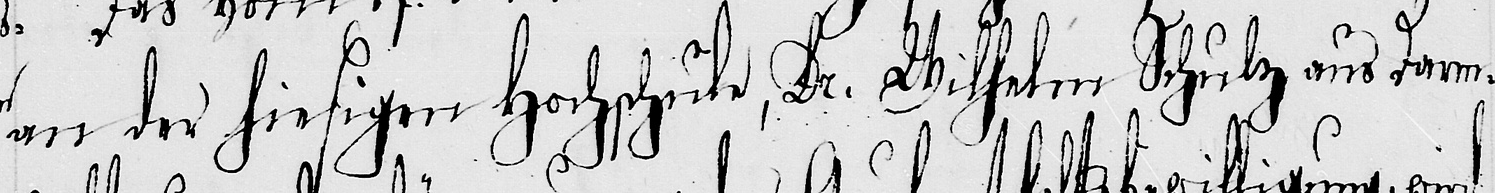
an der hiesigen Hochschule, Dr. Wilhelm Schulz aus Darm¬
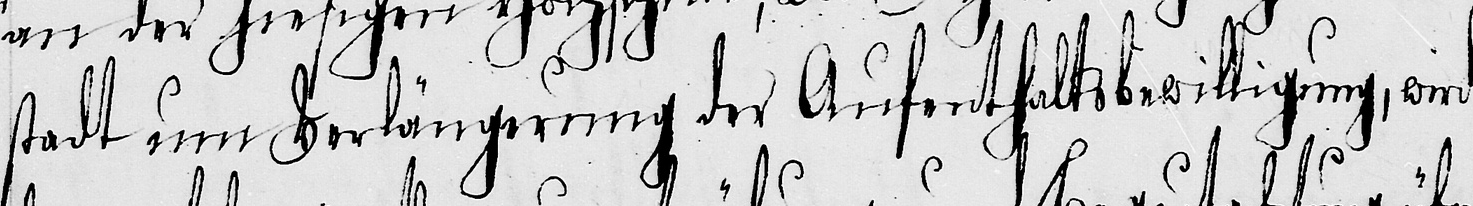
stadt um Verlängerung der Aufenthaltsbewilligung, wi¬
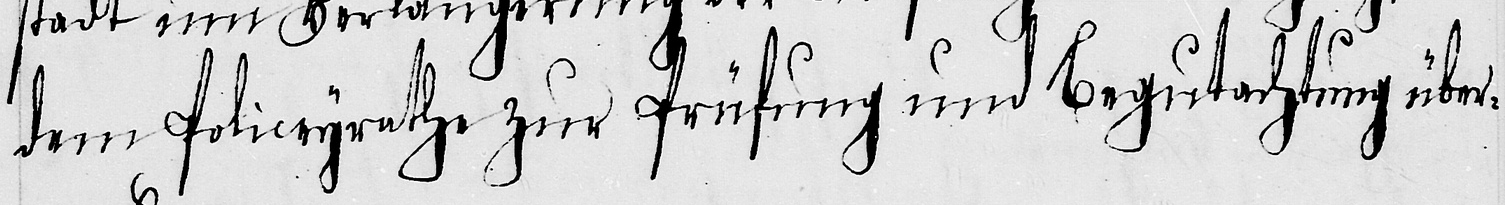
dem Policeyrathe zur Prüfung und Begutachtung über¬
